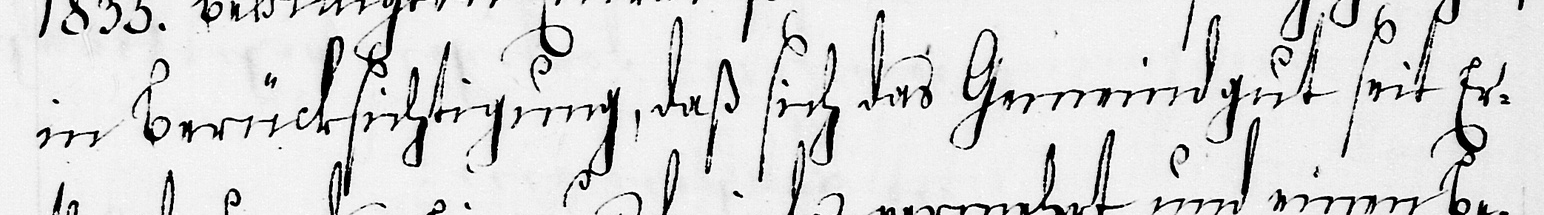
in Berücksichtigung, daß sich das Gemeindgut seit Er¬
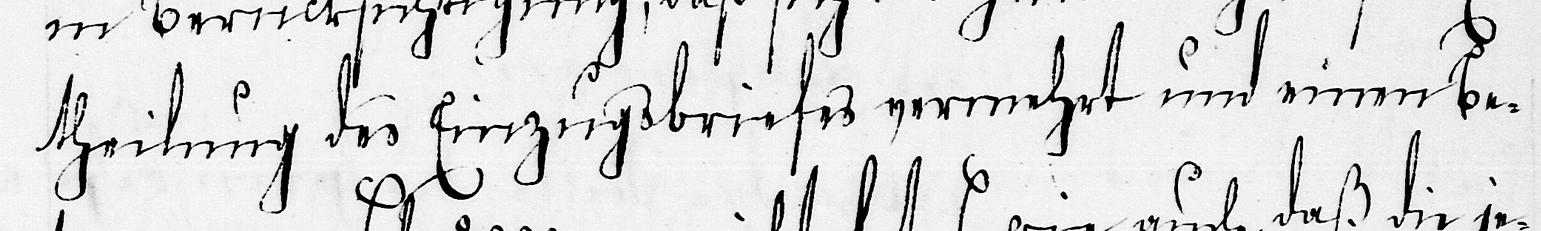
theilung des Einzugsbriefes vermehrt und einen Be¬
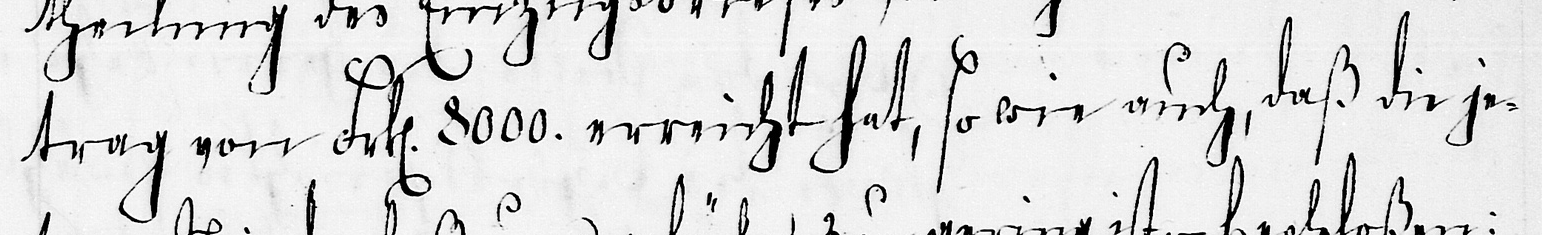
trag von Frk[en]. 8000. erreicht hat, sowie auch, daß die je¬
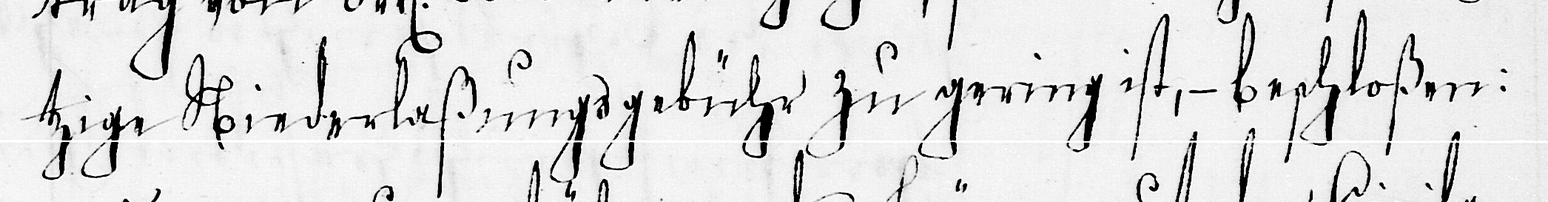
tzige Niederlaßungsgebühr zu gering ist, – beschloßen:
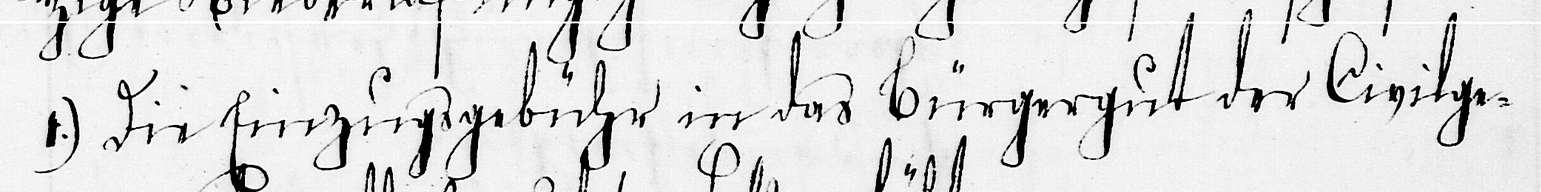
1.) Die Einzugsgebühr in das Bürgergut der Civilge¬
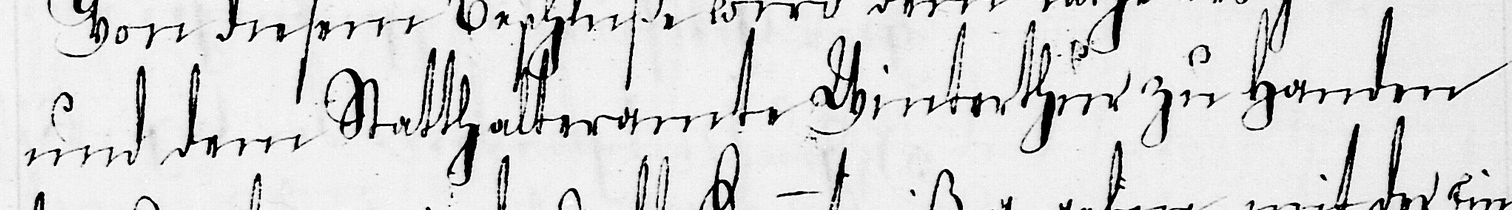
und dem Statthalteramte Winterthur zu Handen
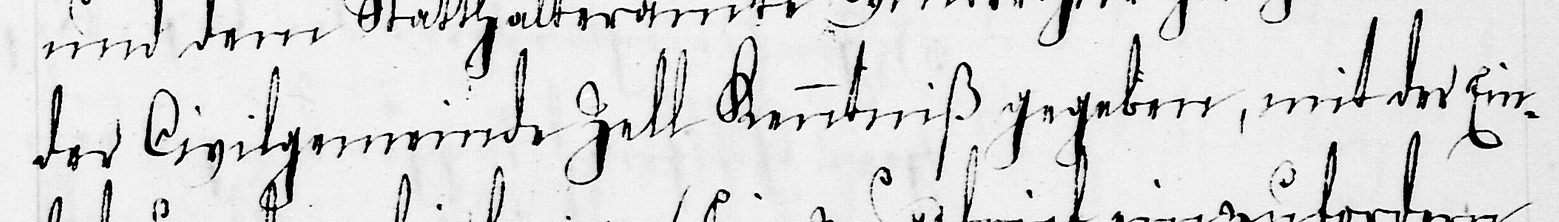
der Civilgemeinde Zell Kenntniß gegeben, mit der Ein¬
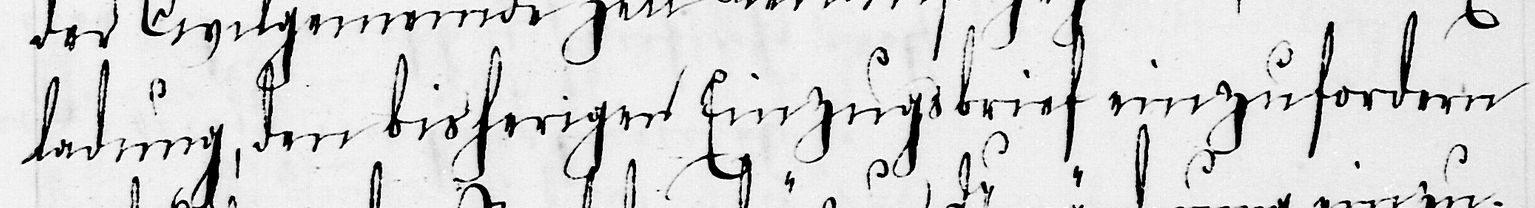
ladung, den bisherigen Einzugsbrief einzufordern
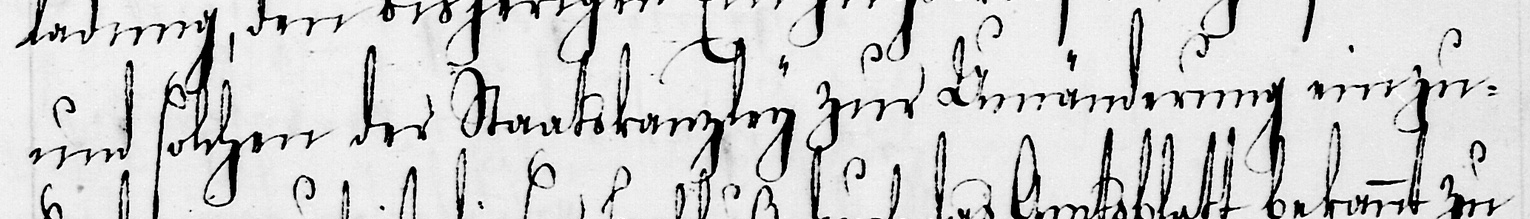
und solchen der Staatskanzley zur Umänderung einzu¬
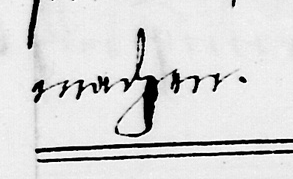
machen.
